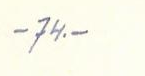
74
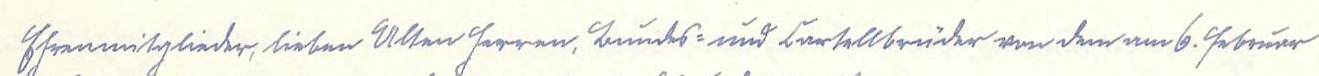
Ehrenmitglieder, liebe Alte Herren, Bundes- und Cartellbrüder von dem am 6. Februar
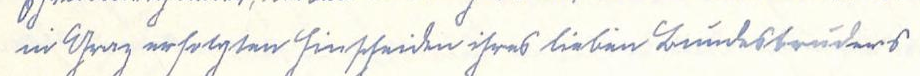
in Graz erfolgten Hinscheiden ihres geliebten Bundesbruders
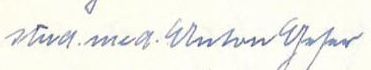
stud. med. Anton Geser
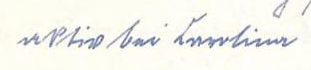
aktiv bei Carolina
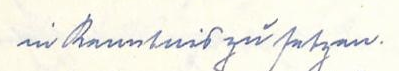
in Kenntnis zu setzen.
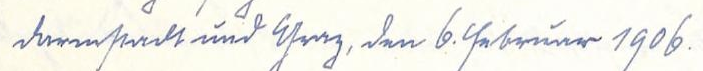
Darmstadt und Graz, den 6. Februar 1906.
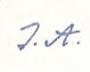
I. A.
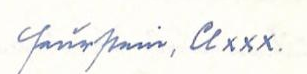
Feurstein, Cl xxx
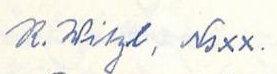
R. Witzl, Ns XX
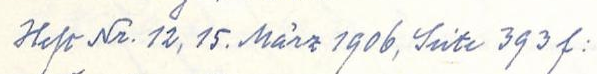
Heft Nr 12, 15. März 1906, Seite 393 f.:
